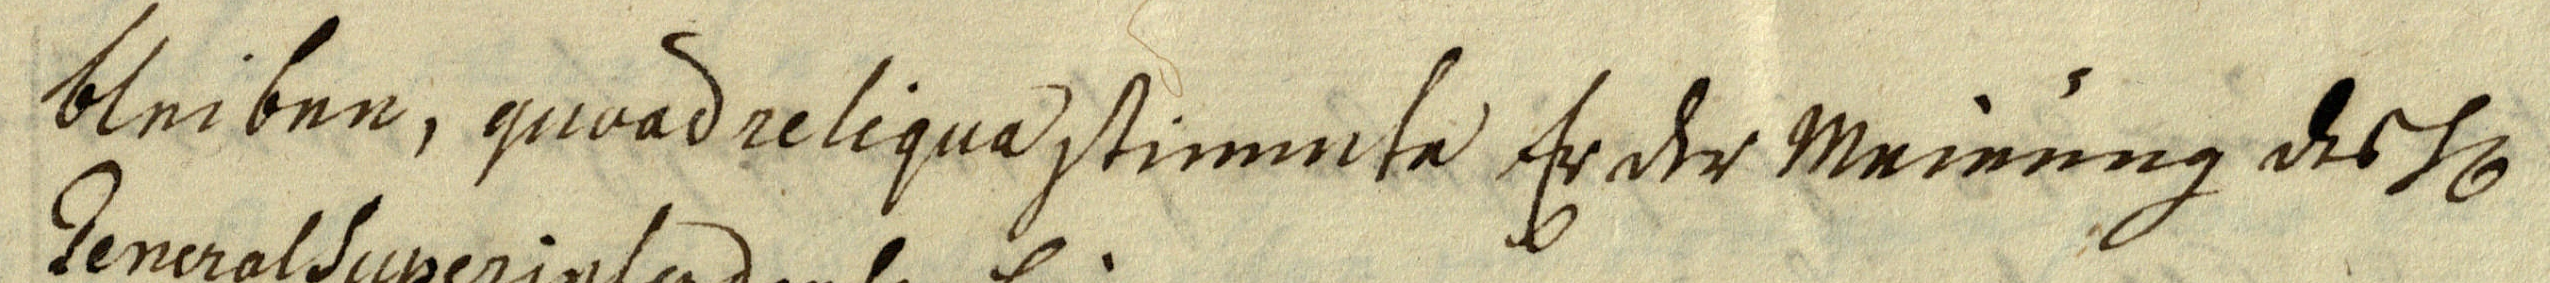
bleiben, quvad reliqua stimmte Er der Meinung des H.
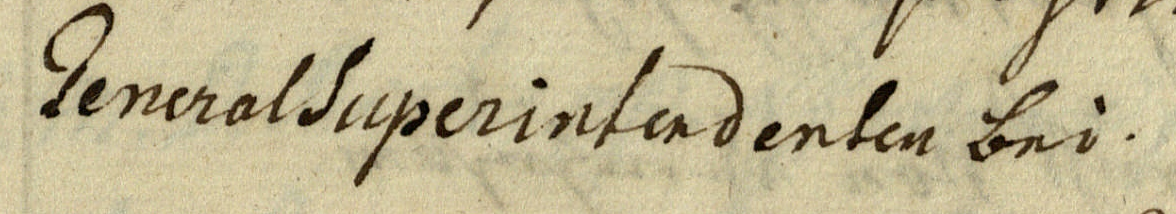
GeneralSuperintendenten bei.
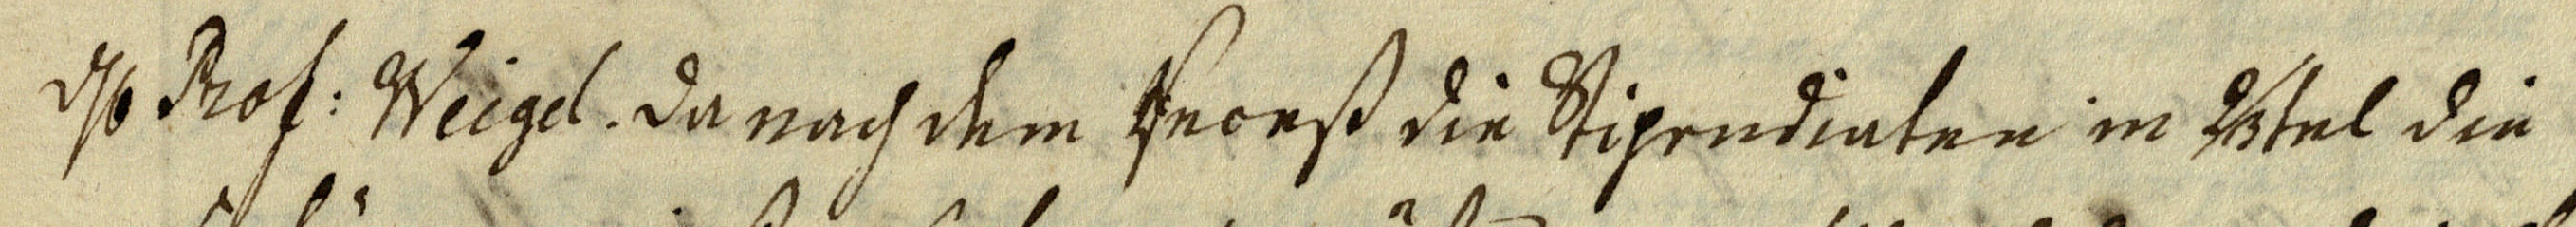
dh Prof. Weigel. da nach dem Receß die Stipendiaten in ²/³ tel die
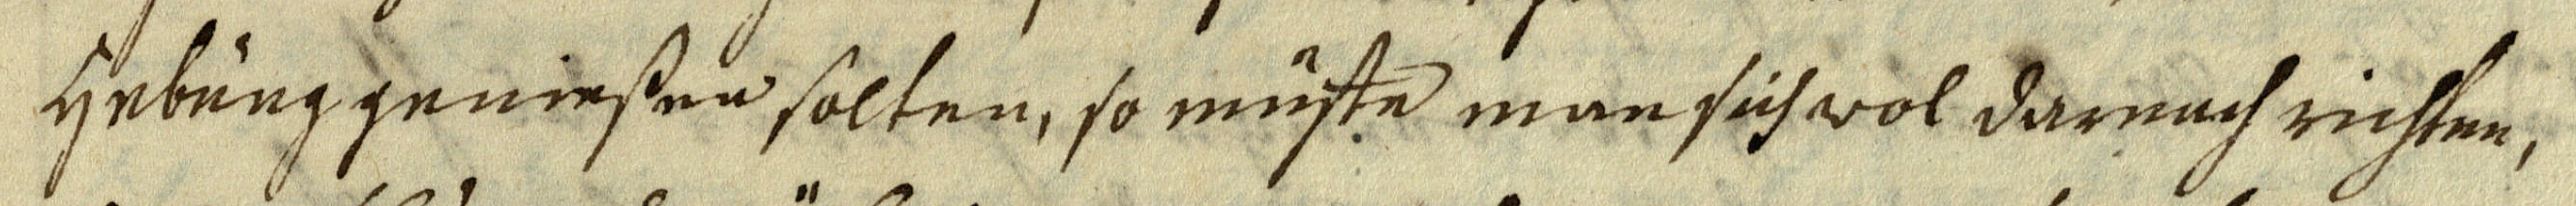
Hebung genießen solten, so müste man sich wol darnach richten,
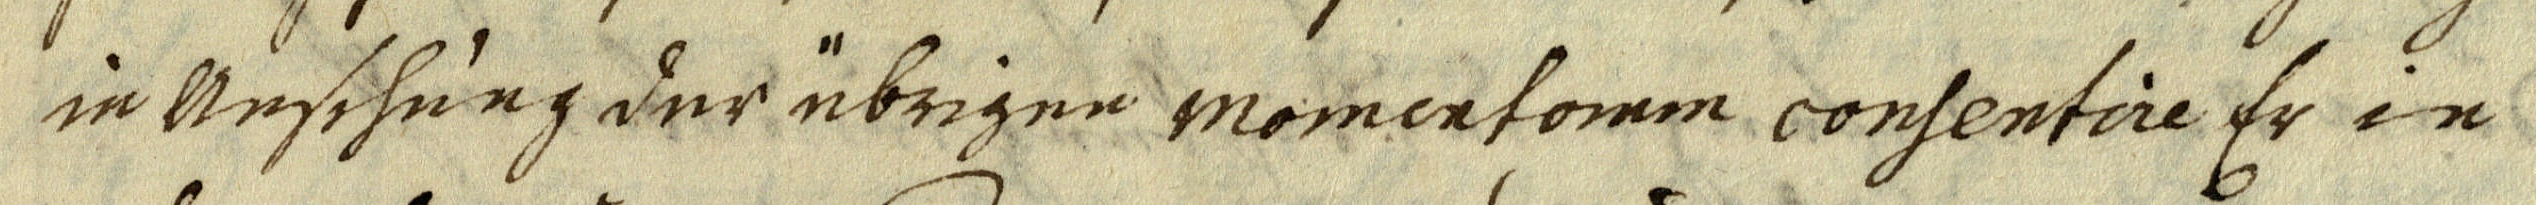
in Ansehung der übrigen momentorem consentire Er in
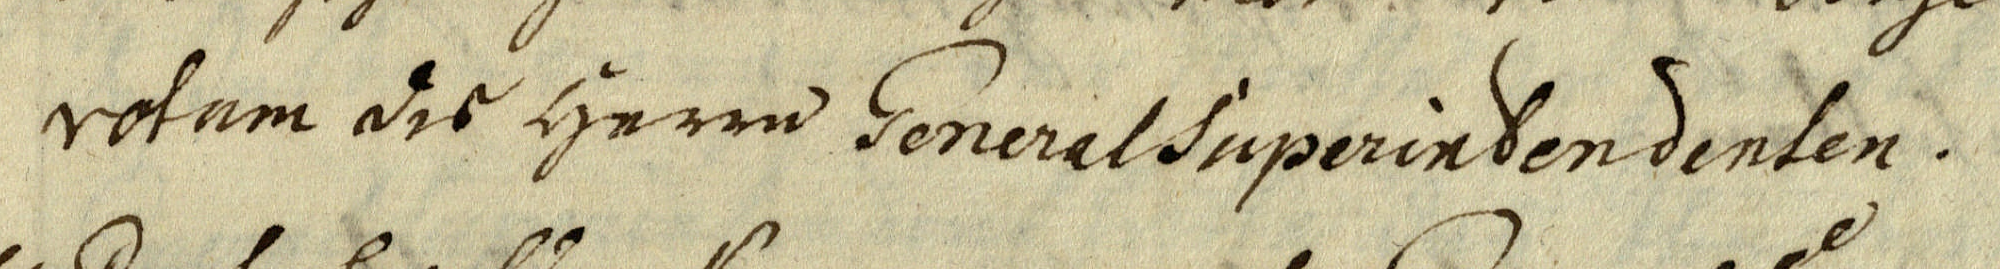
votam des Herrn GeneralSuperintendenten.
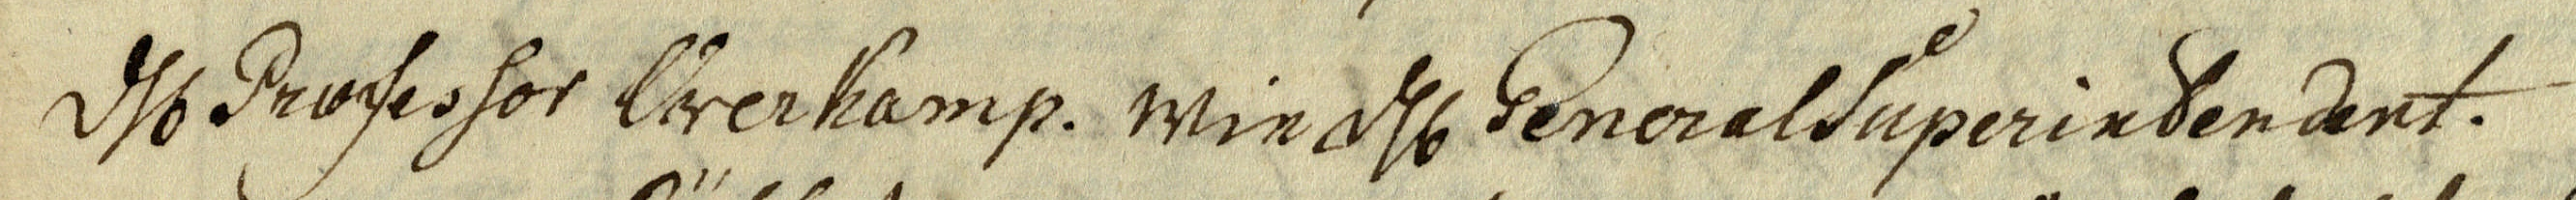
dh Professor Overkamp. wie der dh GeneralSuperintendent.
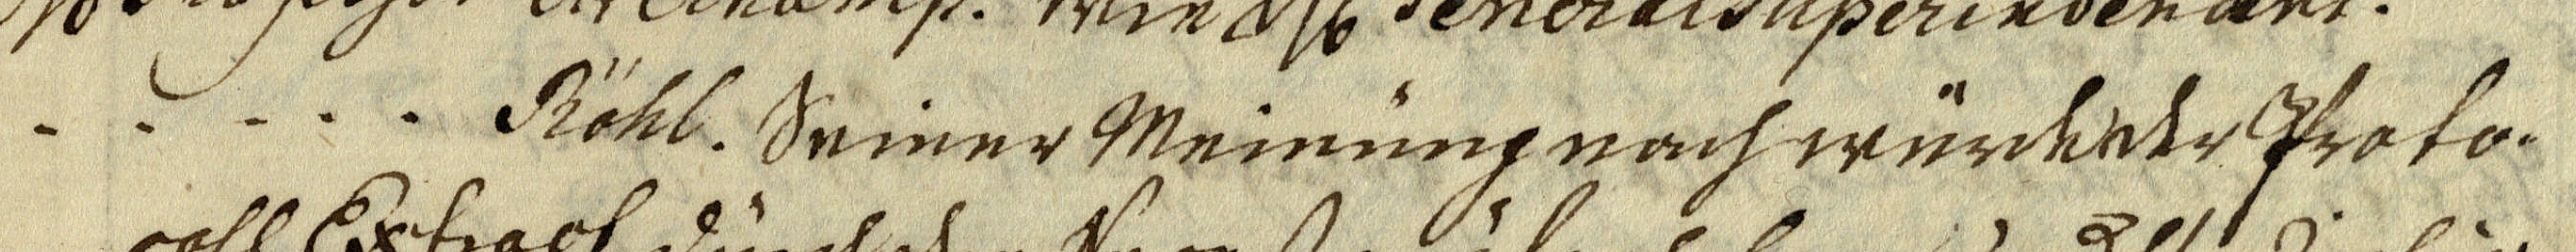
Röhl. Seiner Meinung nach würde der Proto¬
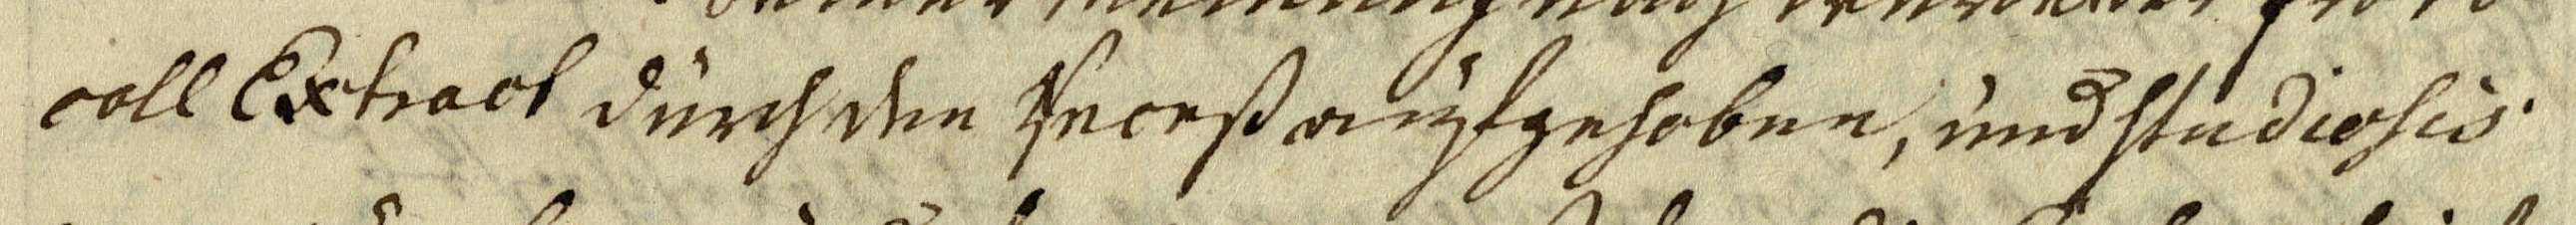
coll Extract durch den Receß aufgehoben, und studiosis
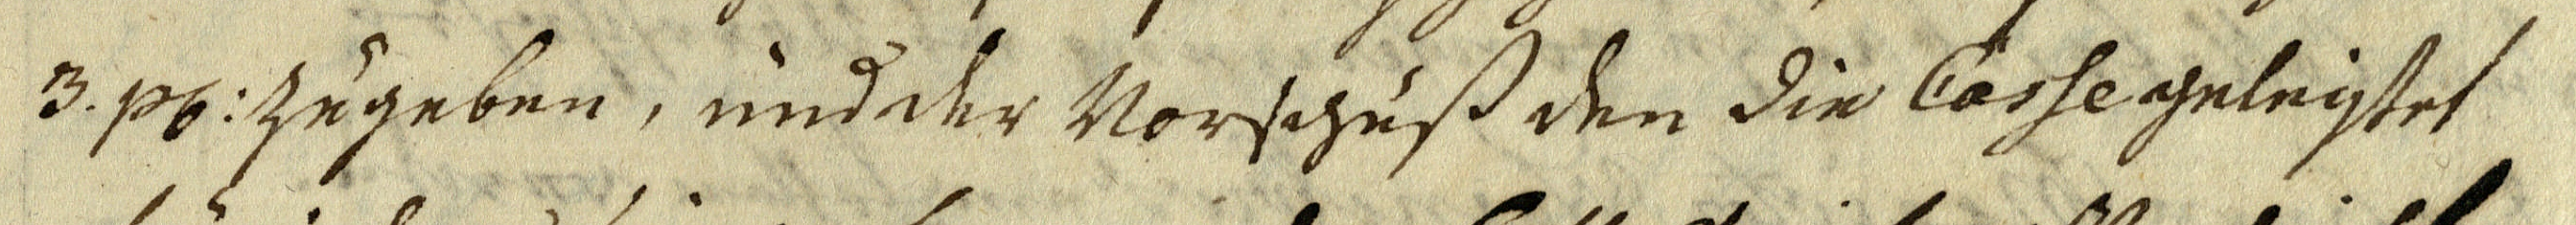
3 p. zugeben, und der Vorschuß, den die Casse geleistet
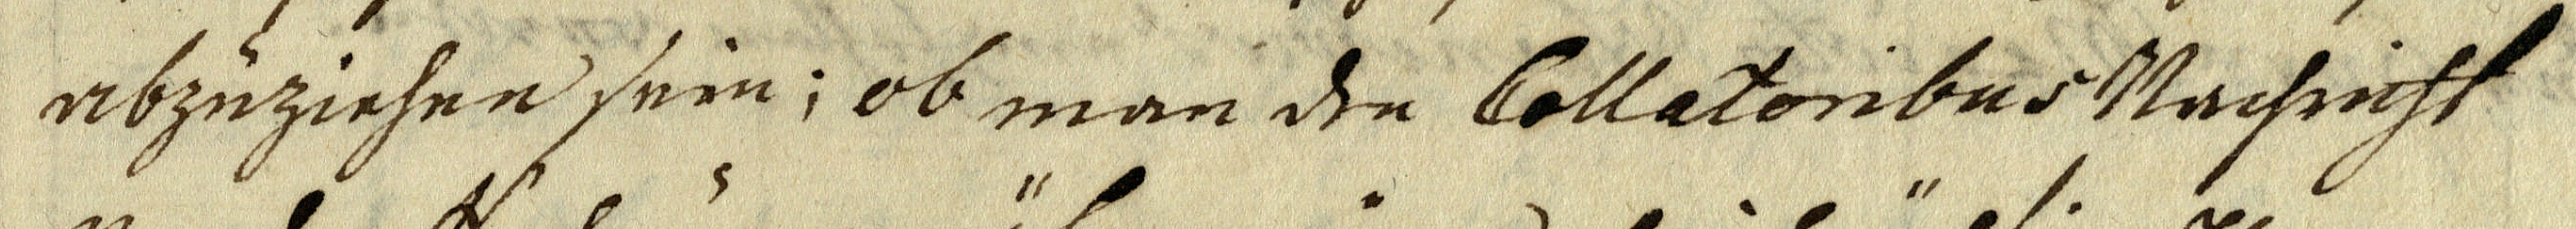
abzuziehen sein; ob man den Collatoribus nachricht
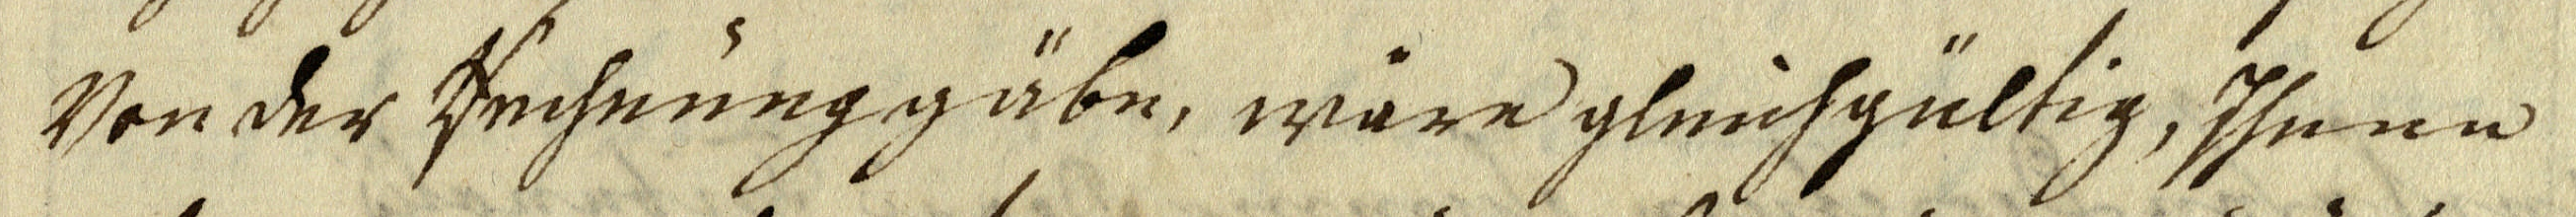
von der Rechnung gäbe, wäre gleichgültig, Ihnen
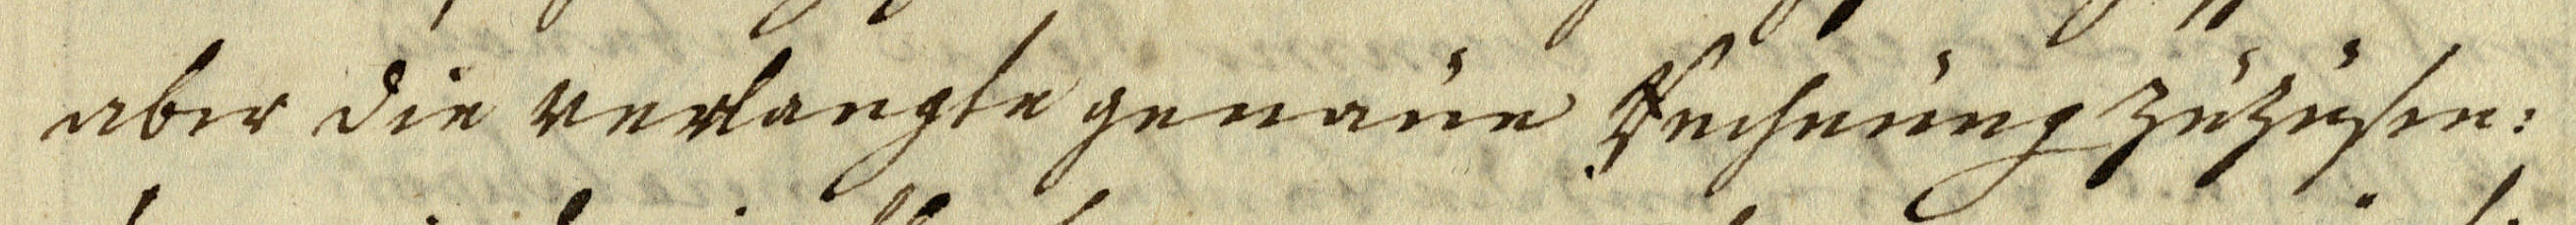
aber die verlangte genaue Rechnung zuzusen¬
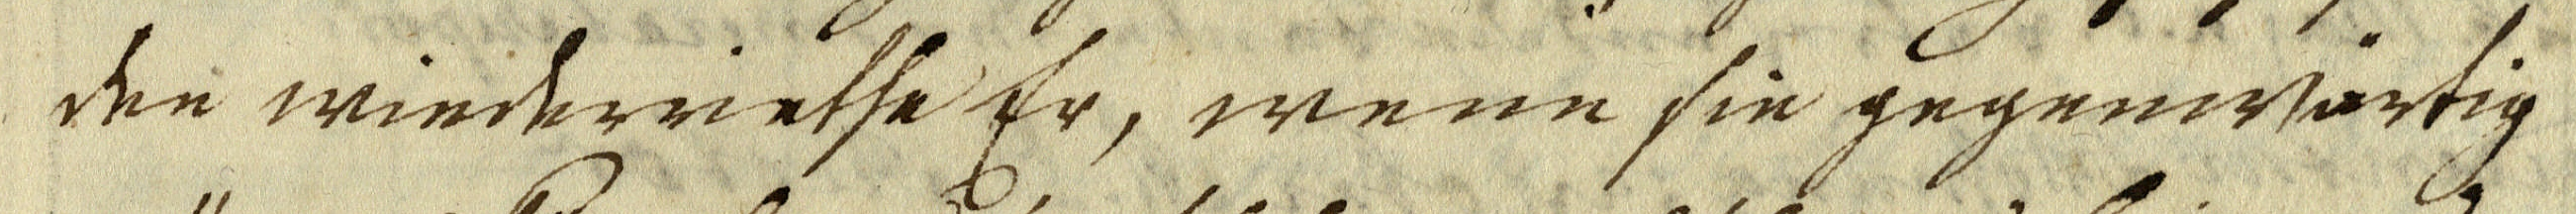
den wiederriethe Er, wenn sie gegenwärtig
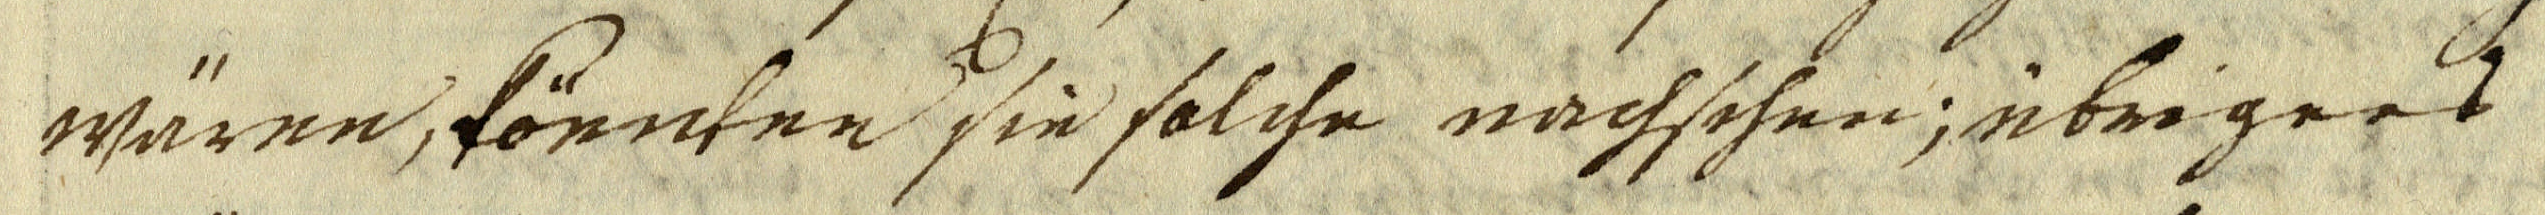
wären, könnten sie solche nachsehen; übrigens
